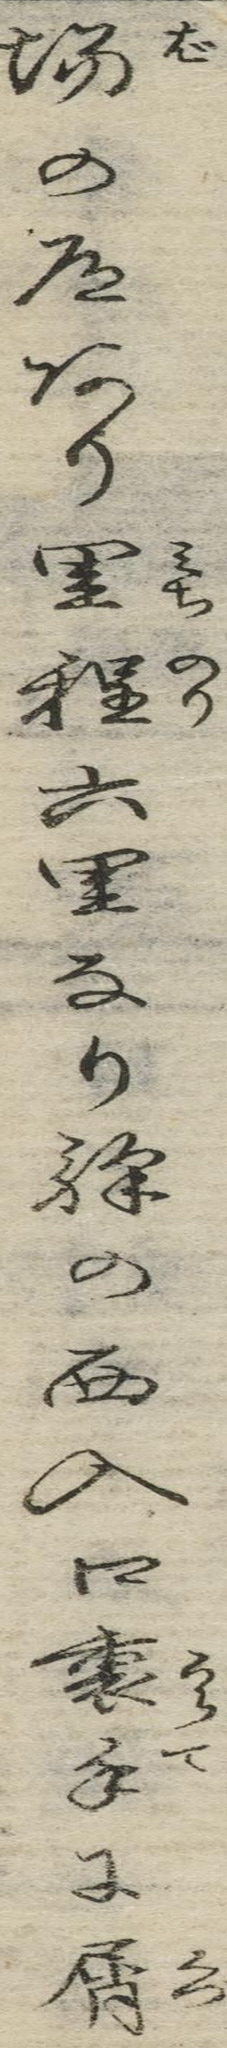場の道あり里？程六里なり驛の西入口裏手に屑
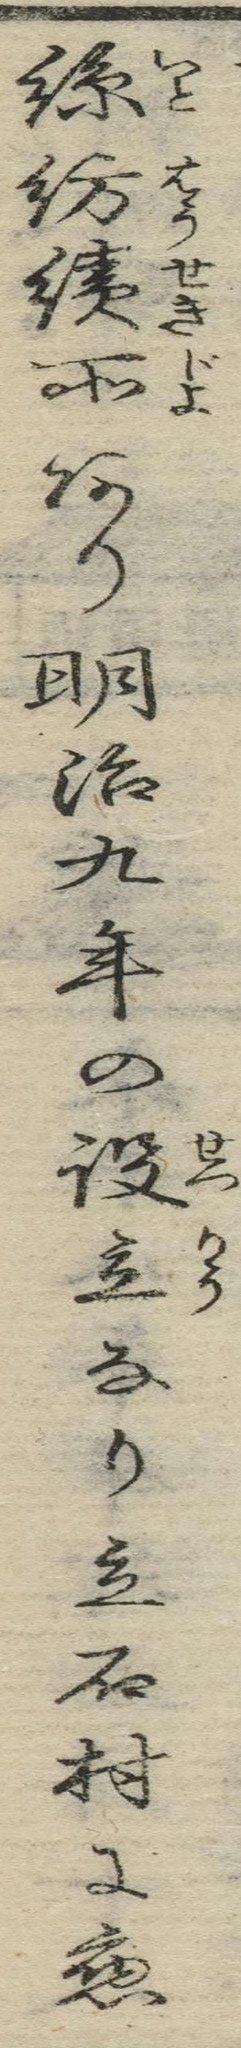絲紡績所あり明治九年の設立なり立石村に応

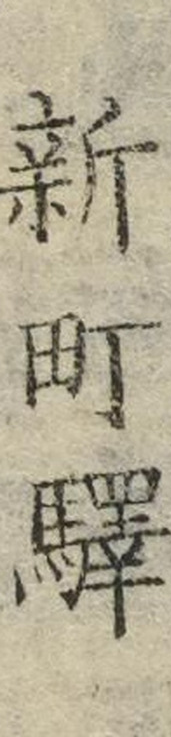新町驛
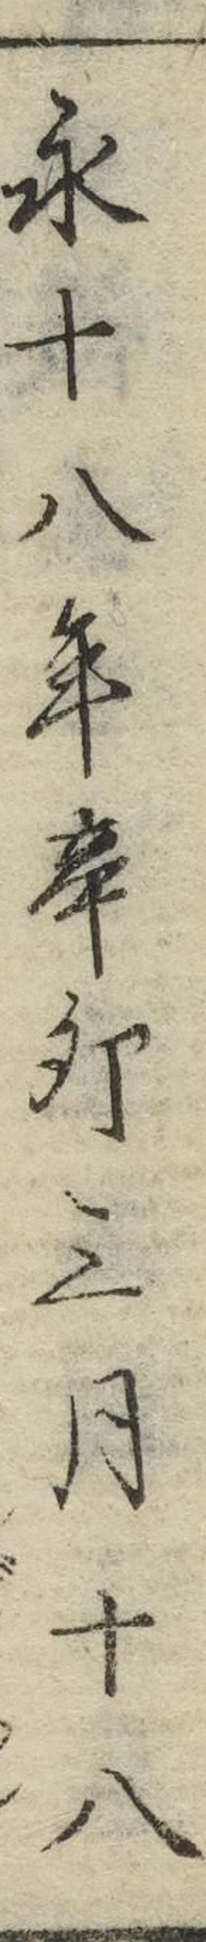永十八年辛卯三月十八日
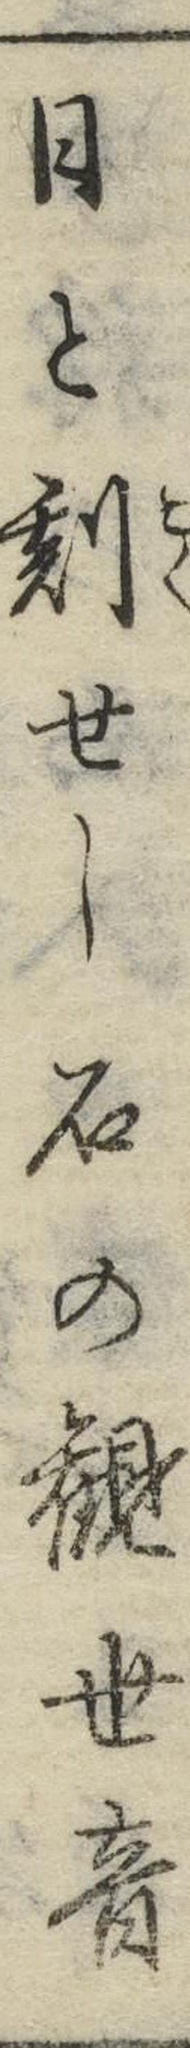と刻せし石の観世音
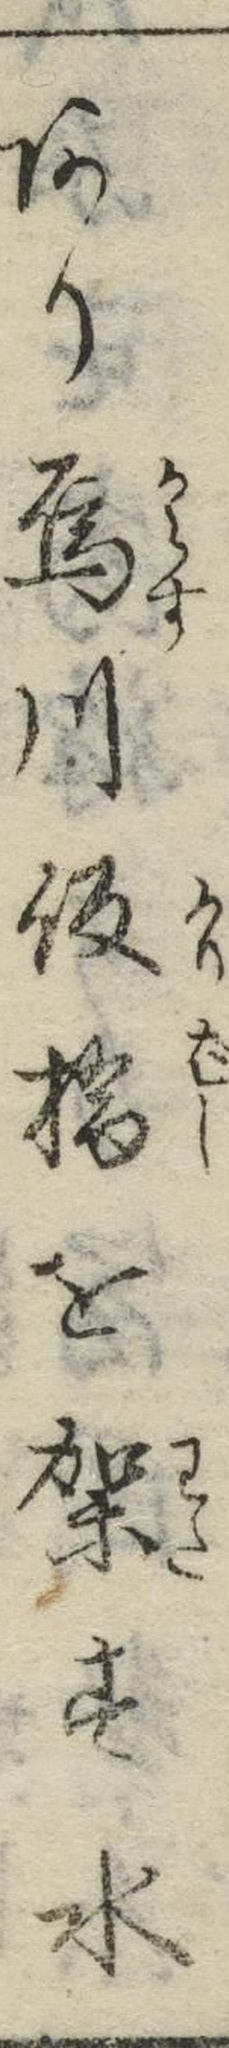あり烏川仮橋を架す水
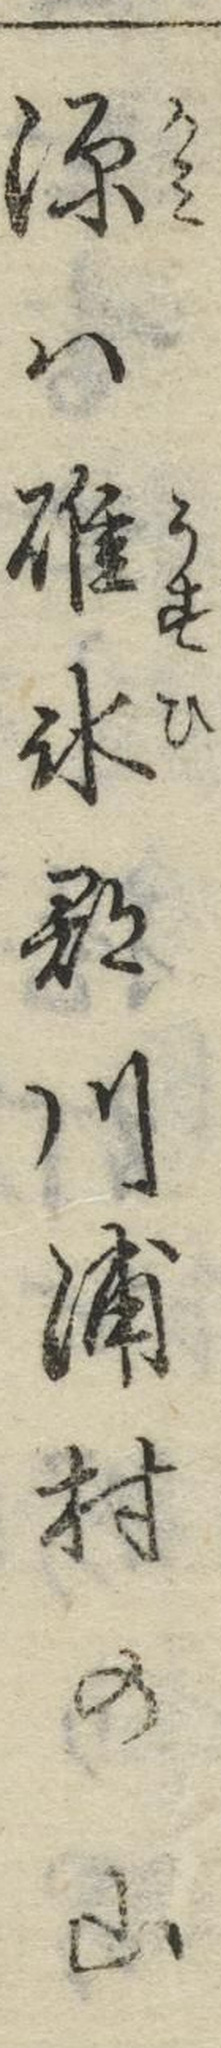源は碓氷郡川浦村の山
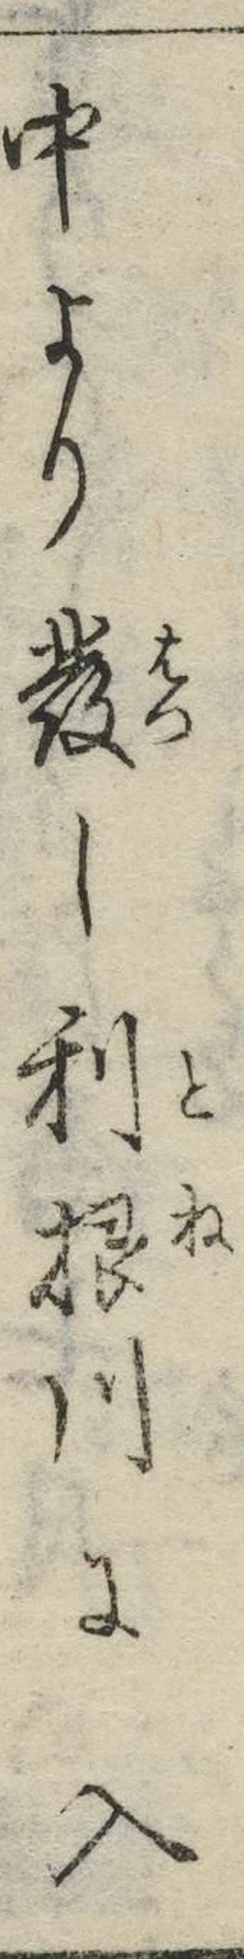中より發し利根川に入
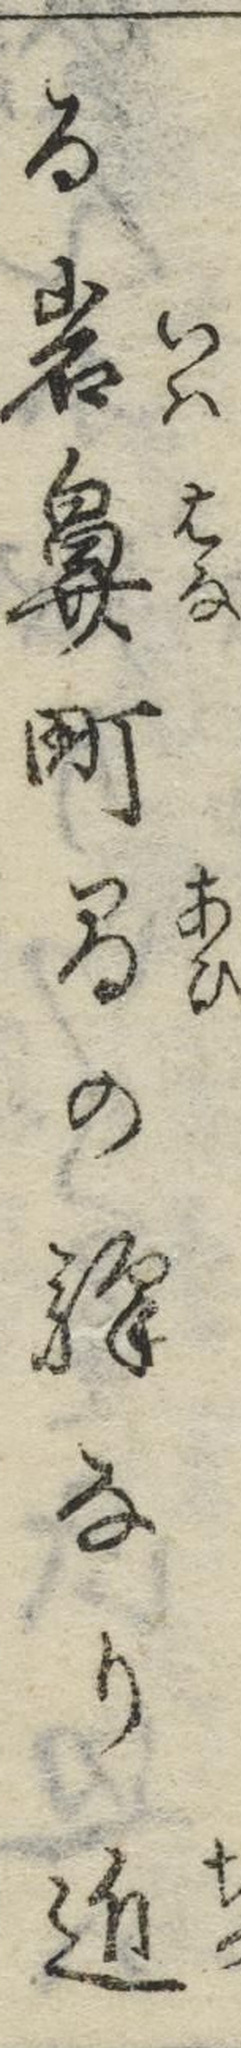る岩鼻町間の驛なり近
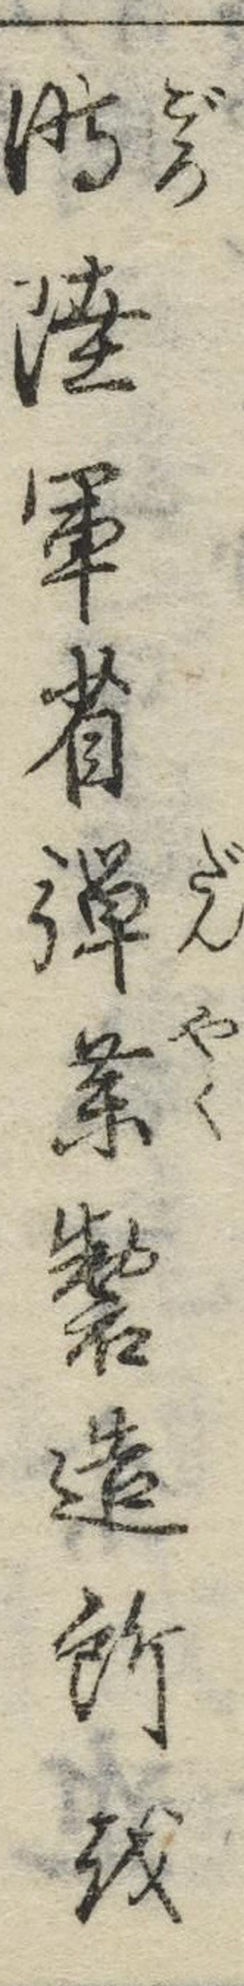頃陸軍省弾薬製造所を
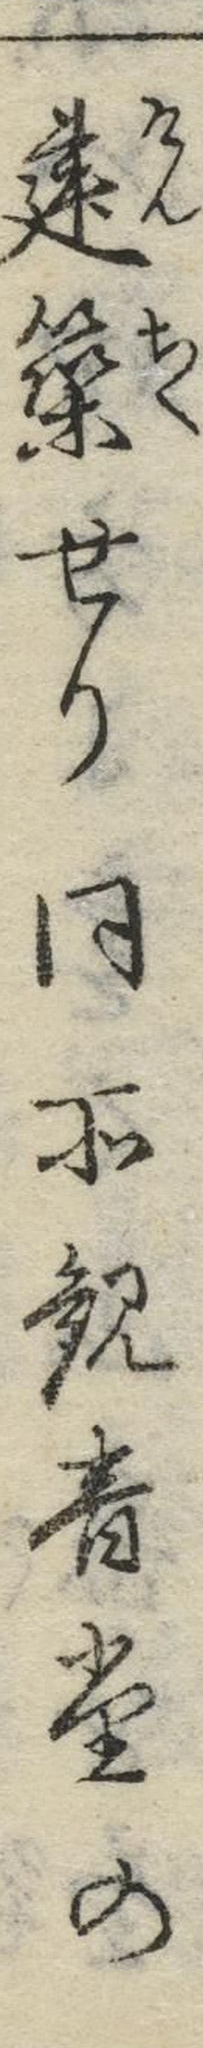建築せり同所観音堂の
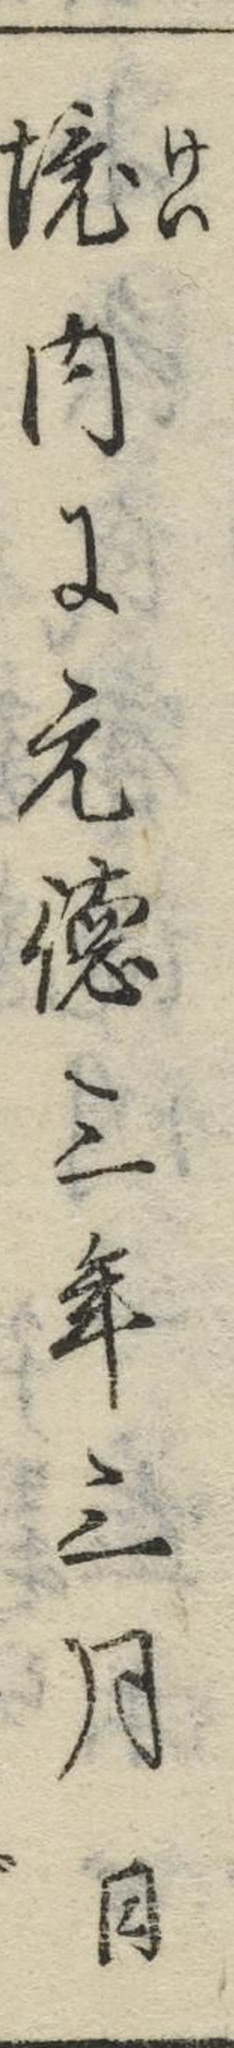境内に元徳三年三月日
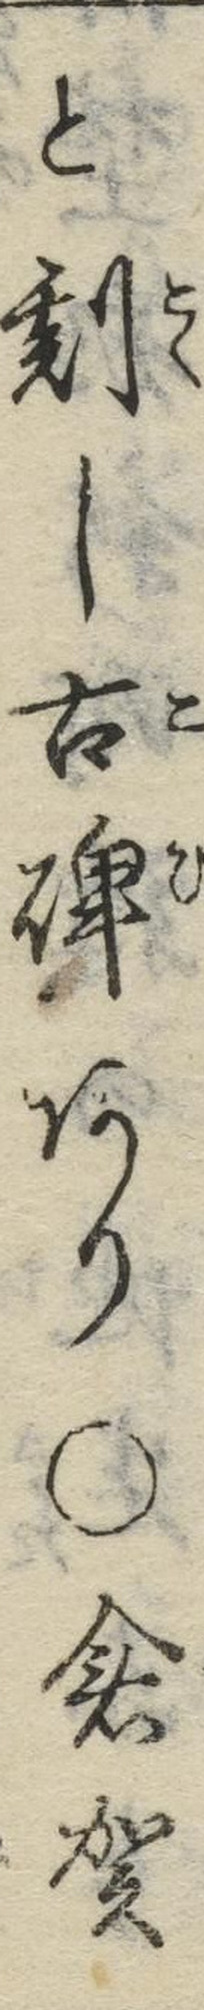と刻し古碑あり○倉賀
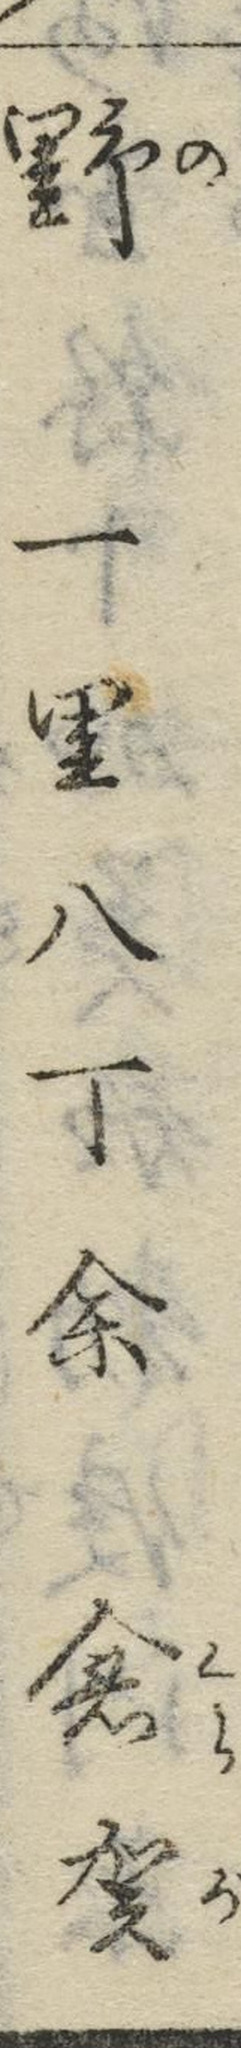野一里八丁余倉賀
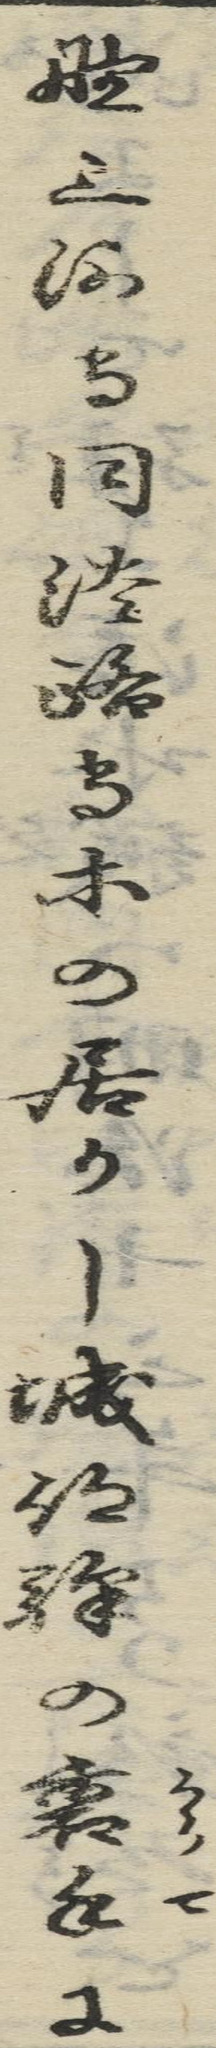野三河守同淡路守等の居りし城跡驛の裏手に
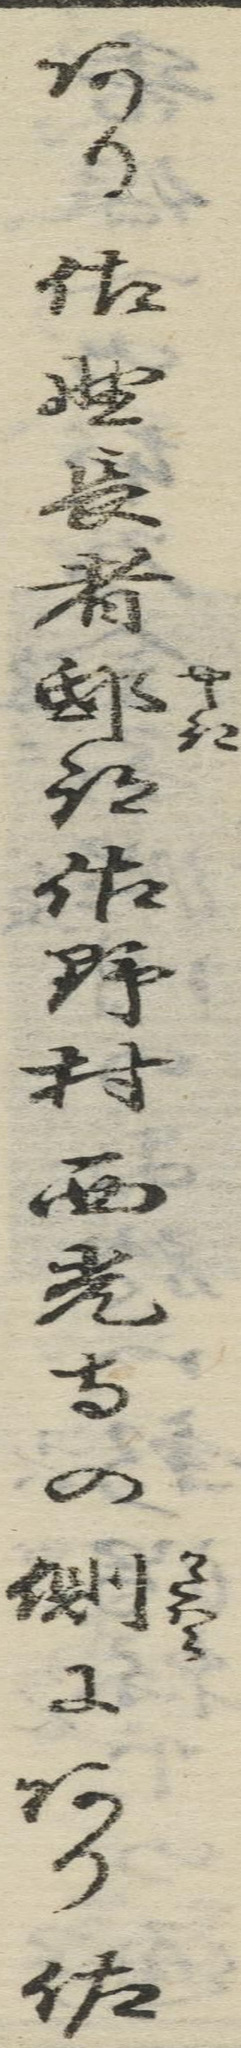あり佐野長者邸跡佐野村西光寺の側にあり佐
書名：上州伊香保鑛泉圖會　全
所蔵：東京大学地震研究所図書室 Earthquake Research Institute Library, The University of Tokyo, JAPAN
